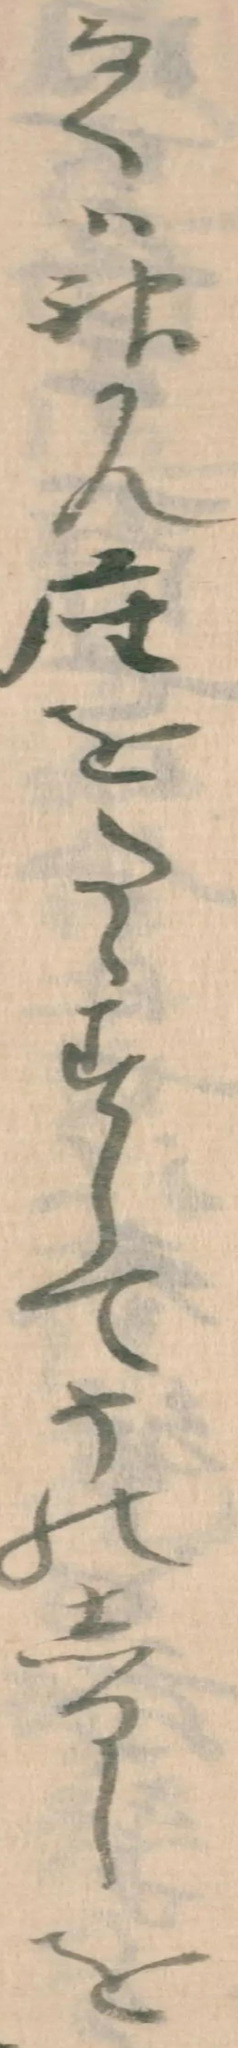なくは神かん座をたゝすしてそのしるしを
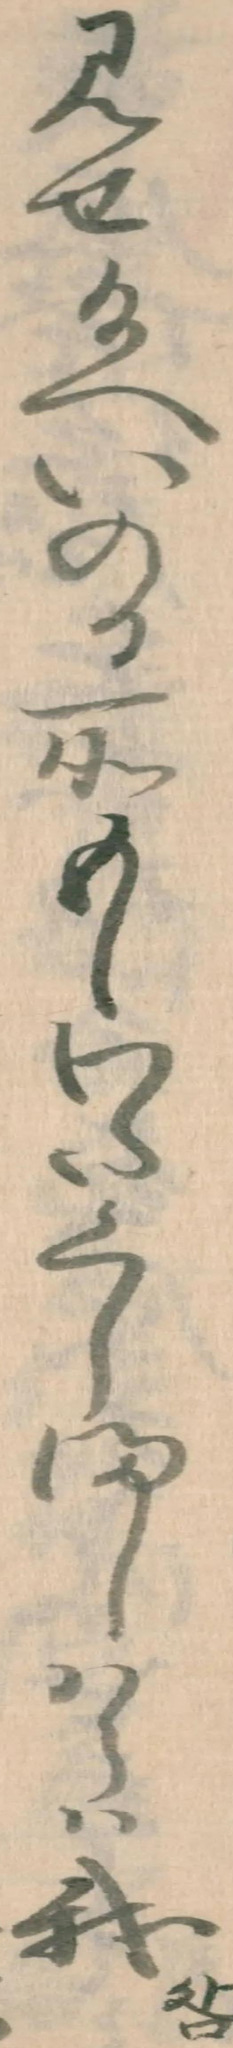見せ給へいのる所もしわたくしましはらは我とか
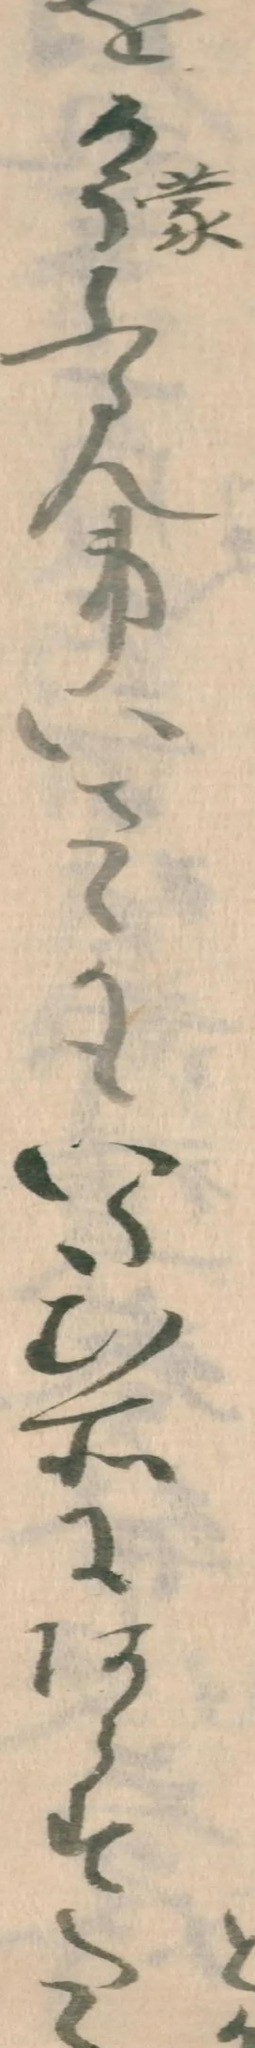をかうふらん事いさゝかもいたむ所にあらすたゝ
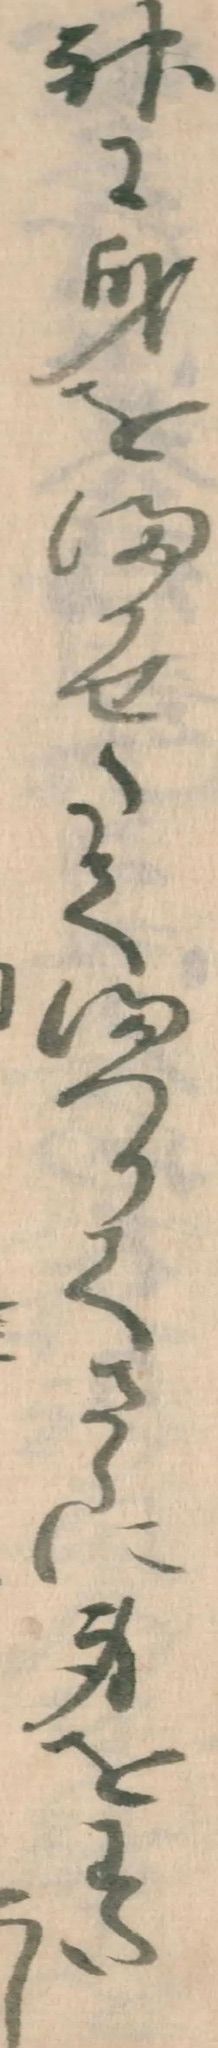神に身をまかせたてまつりてさらに身をわたくし
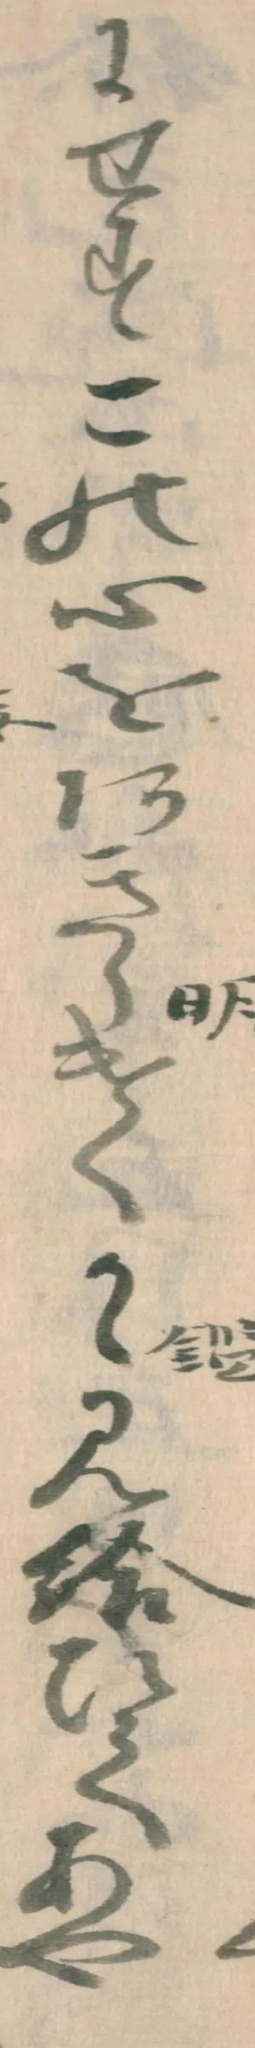にせすこの心をあきらけくかゝみ給ひてあやまる
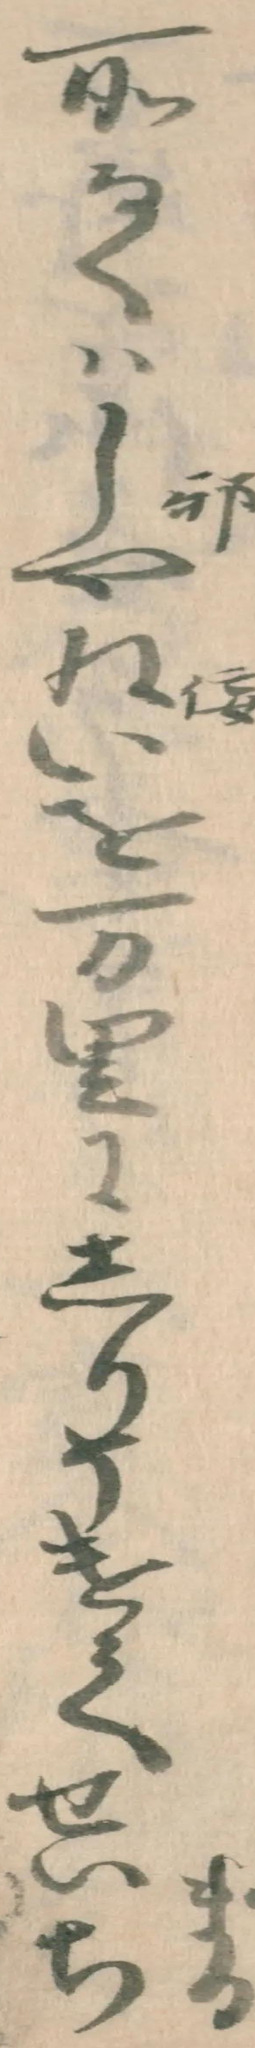所なくはしやねいを万里にしりそけてせいち
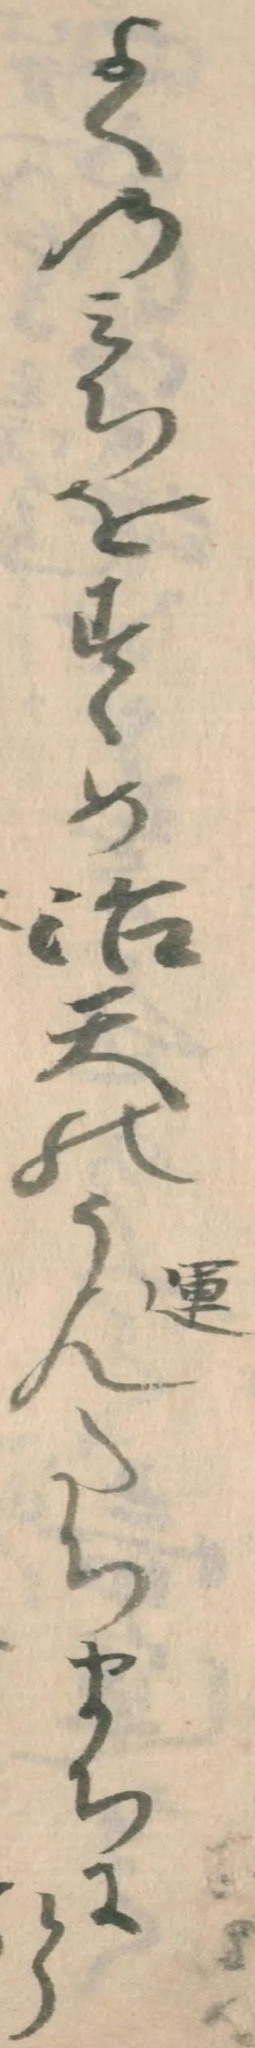よくのみちをすゝめ治天のうんたちまちにひら
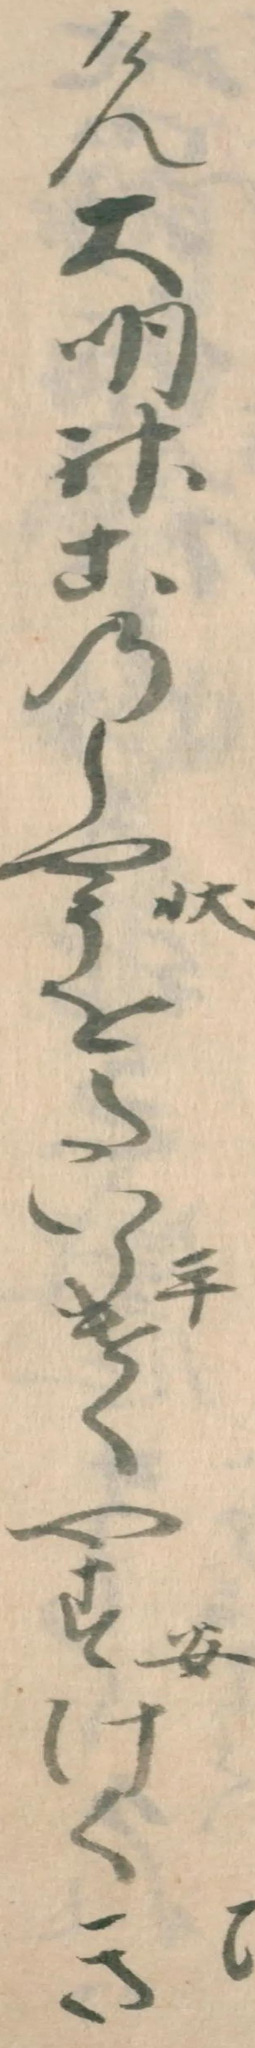けん大明神このしやうをたいらけくやすけくき
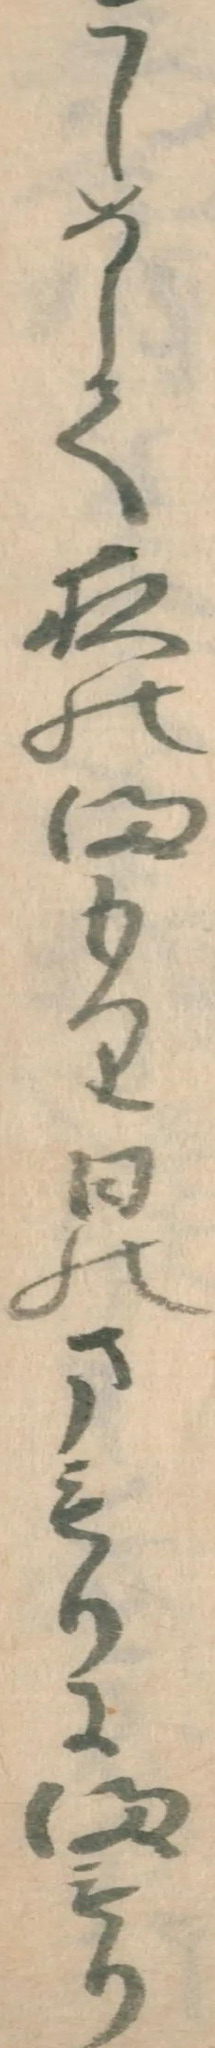こしめして夜のまもり日のまもりにまもり

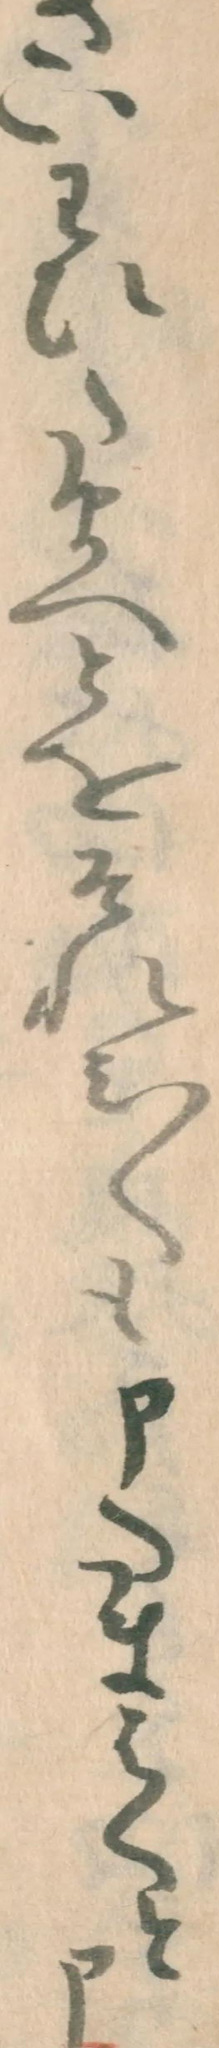さいわひたまへとをそれみ〳〵も申たまはくと申
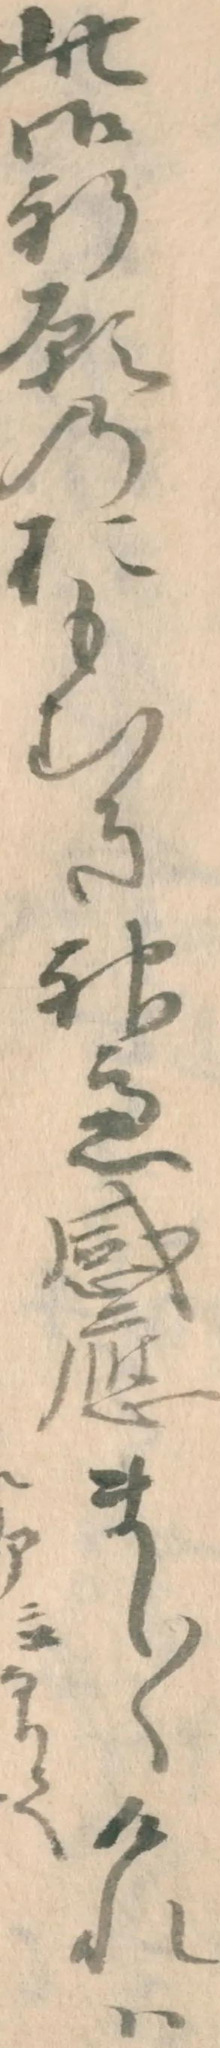此御祈願のおもむき神慮感応まし〳〵けれは
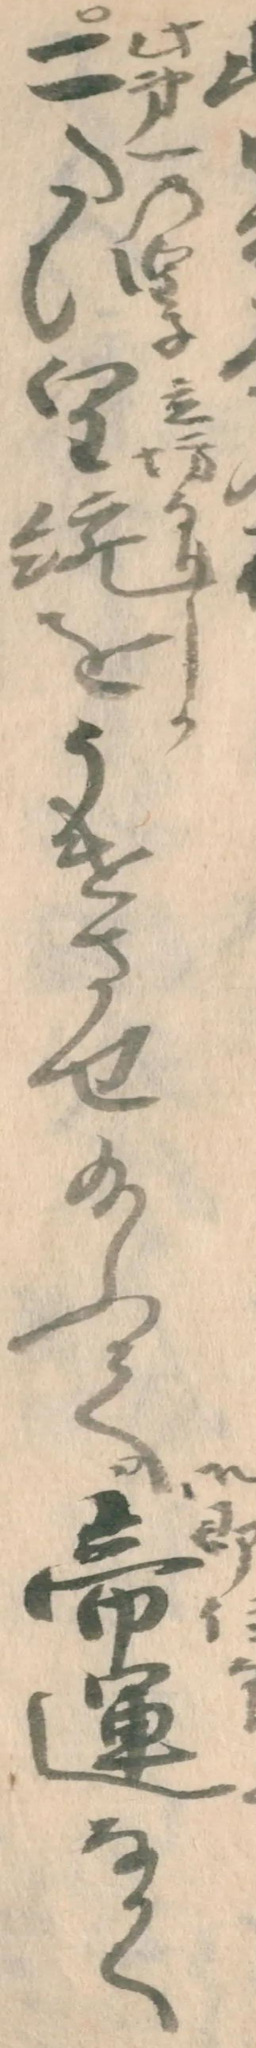◦二たひ皇統をうけさせ給ふて◦帝運なかく
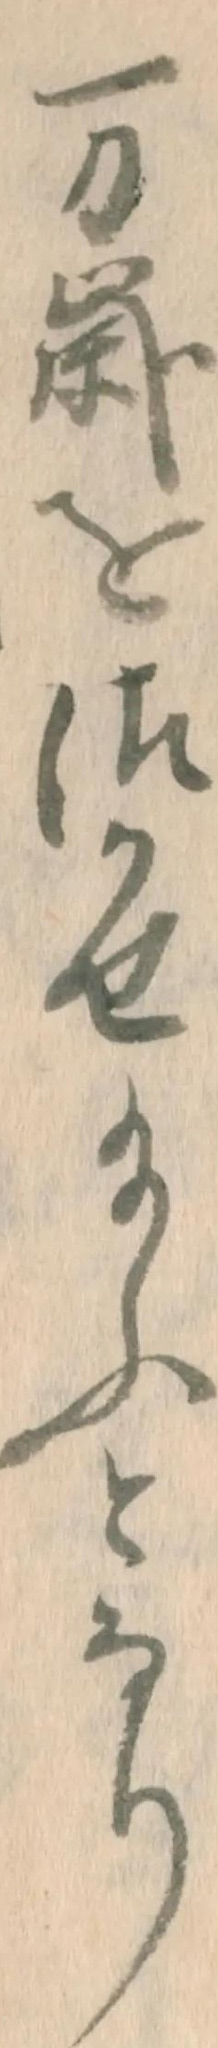万歳をつかせ給ふとなり
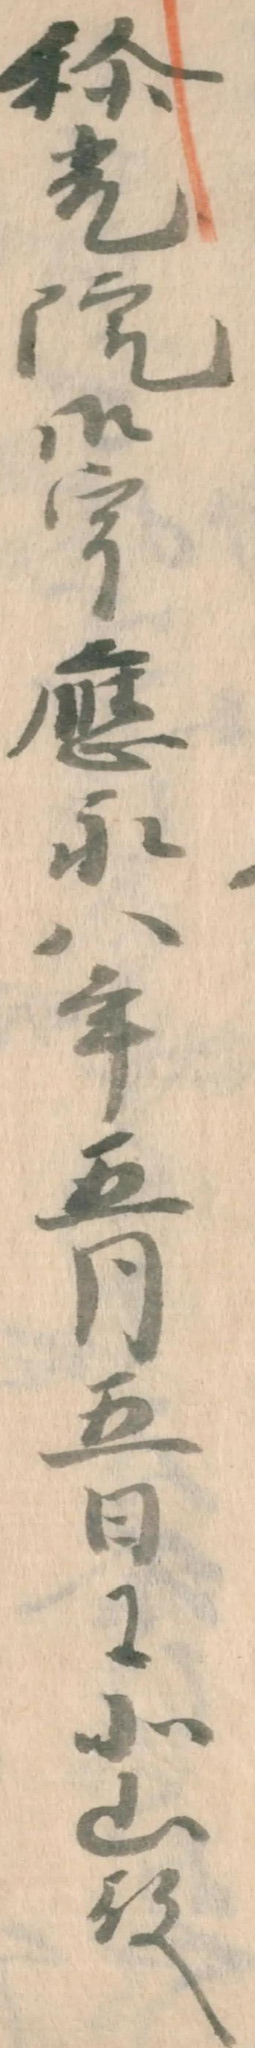称光院御宇応永八年五月五日に北山殿
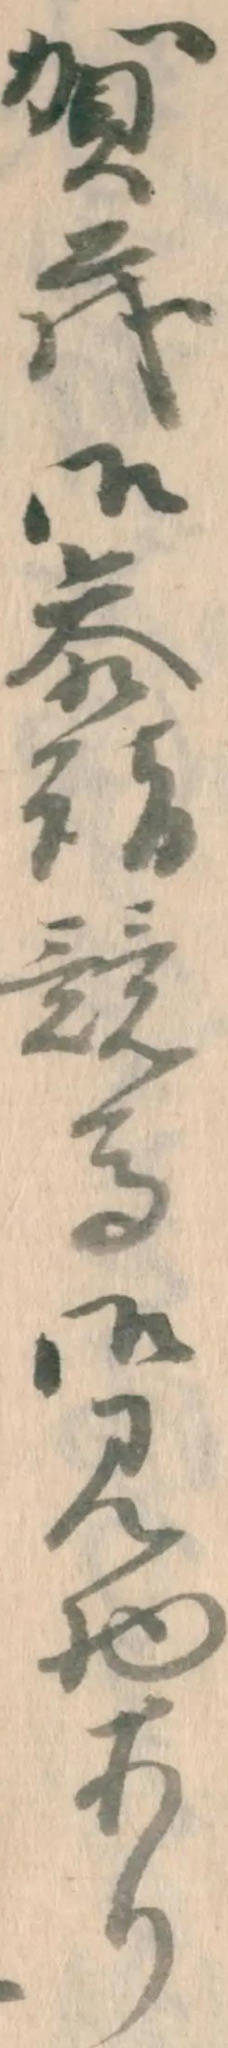賀茂御参詣競馬御見物あり
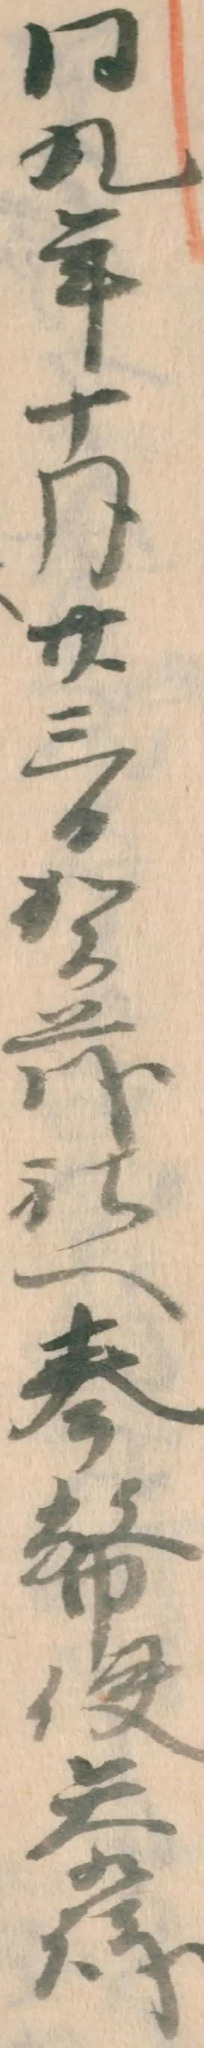同九年十月廿三日賀茂社へ参幣使参儀
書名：賀茂社記録. 第1冊
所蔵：国立国会図書館 National Diet Library, JAPAN
